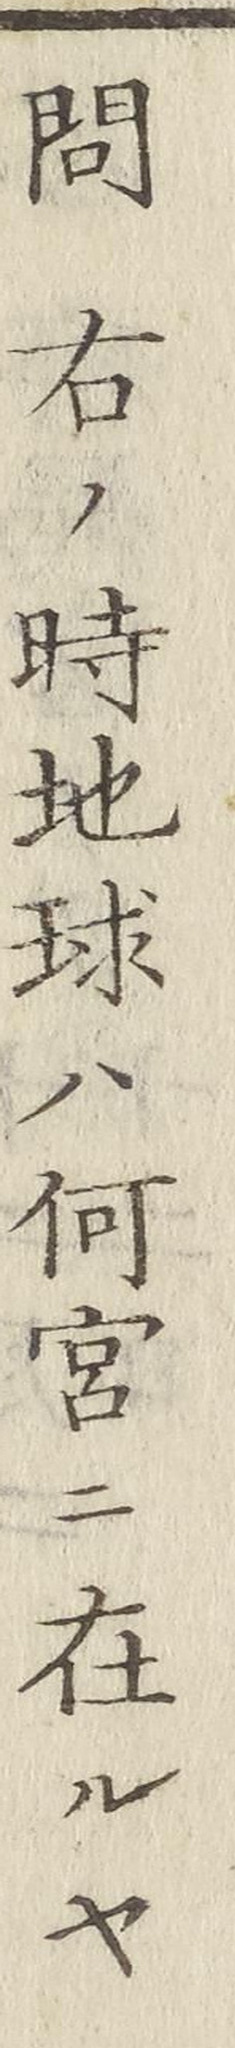問右ノ時地球ハ何宮ニ在ルヤ
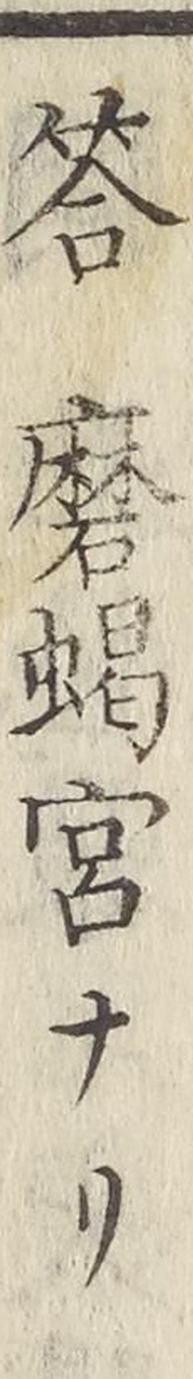答磨蝎宮ナリ
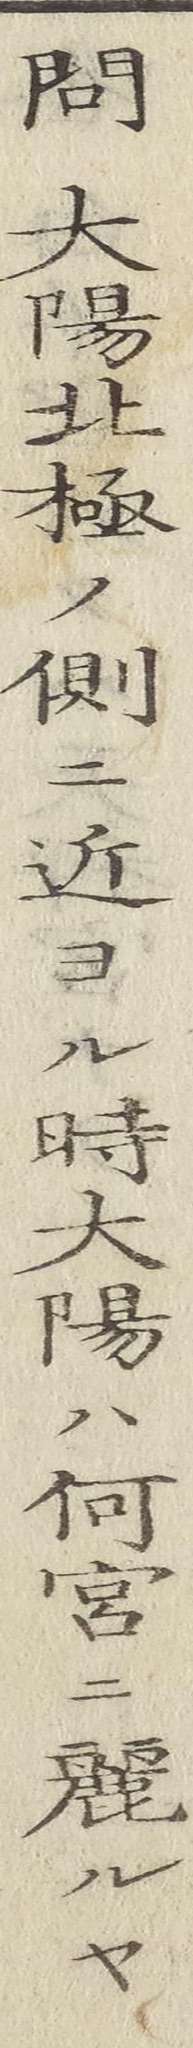問大陽北極ノ側ニ近ヨル時大陽ハ何宮ニ麗ルヤ

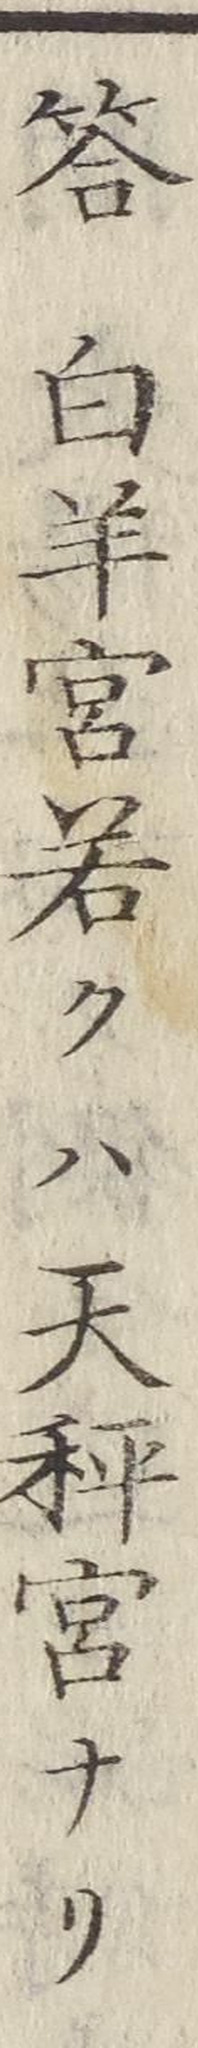答白羊宮若クハ天秤宮ナリ
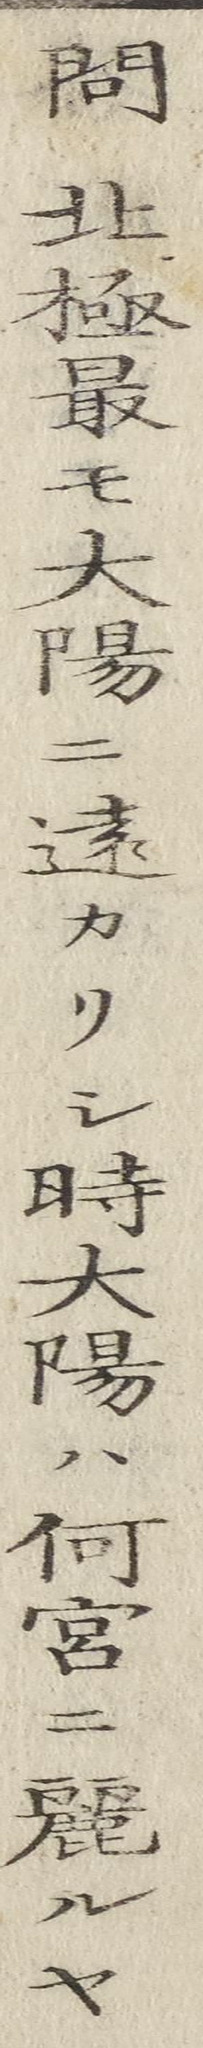問北極最モ大陽ニ遠カリシ時大陽ハ何宮ニ麗ルヤ
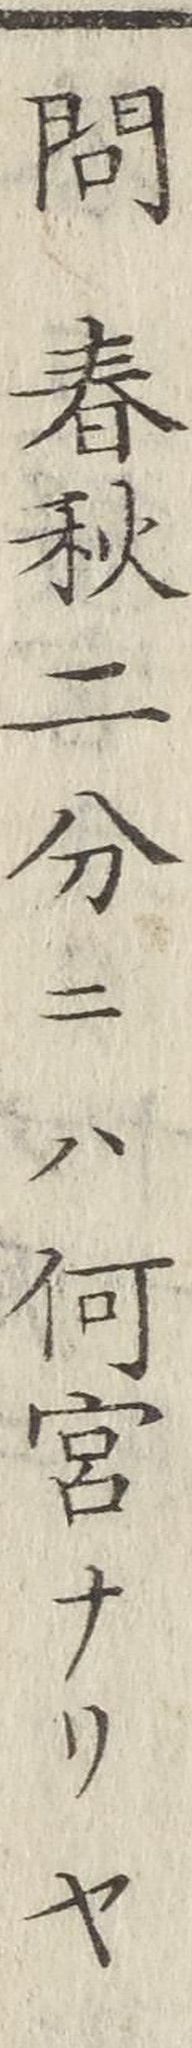問春秋二分ニハ何宮ナリヤ
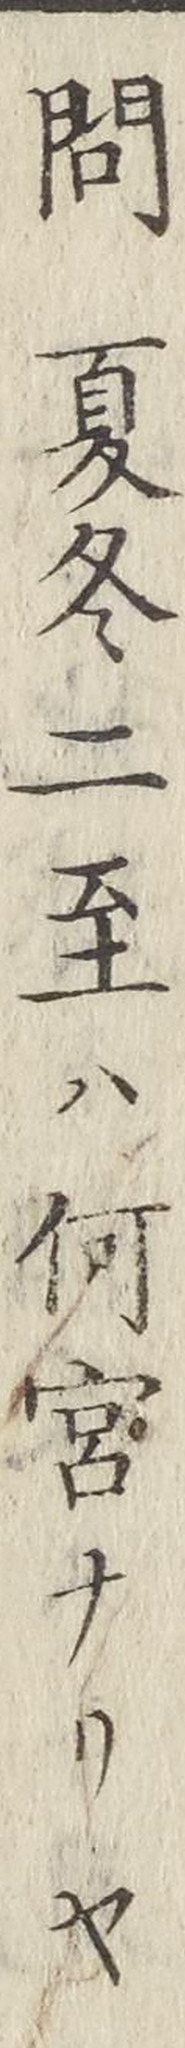問夏冬二至ハ何宮ナリヤ
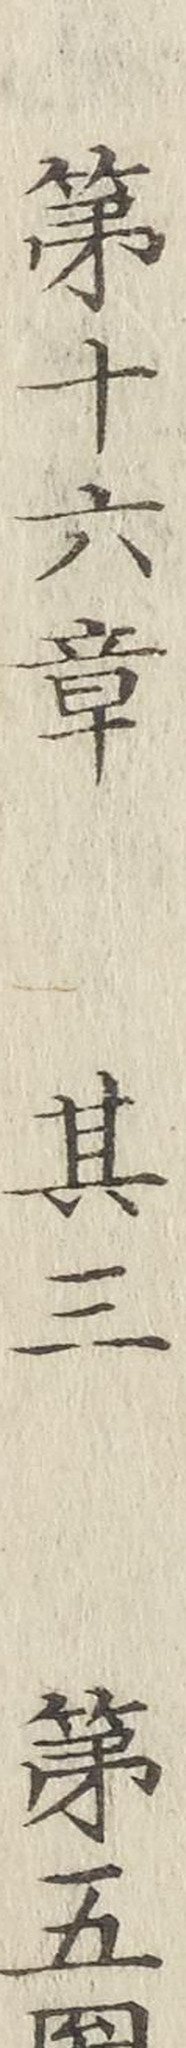第十六章其三第五図
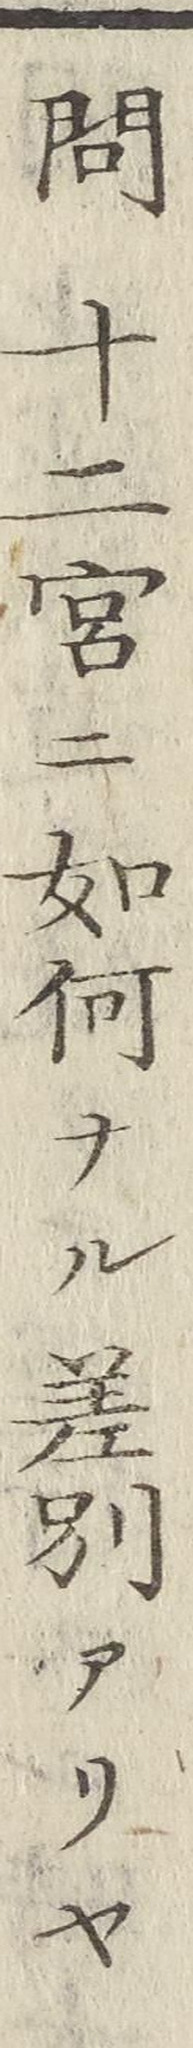問十二宮ニ如何ナル差別アリヤ
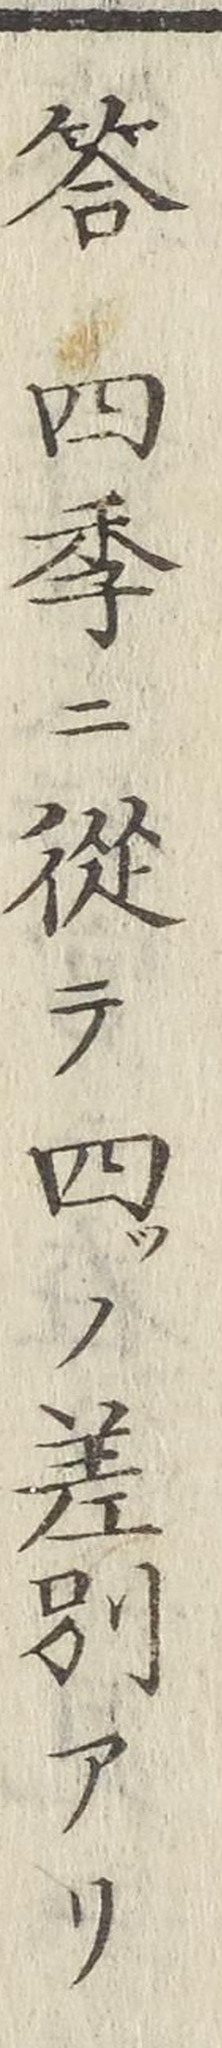答四季ニ従テ四ツノ差別アリ
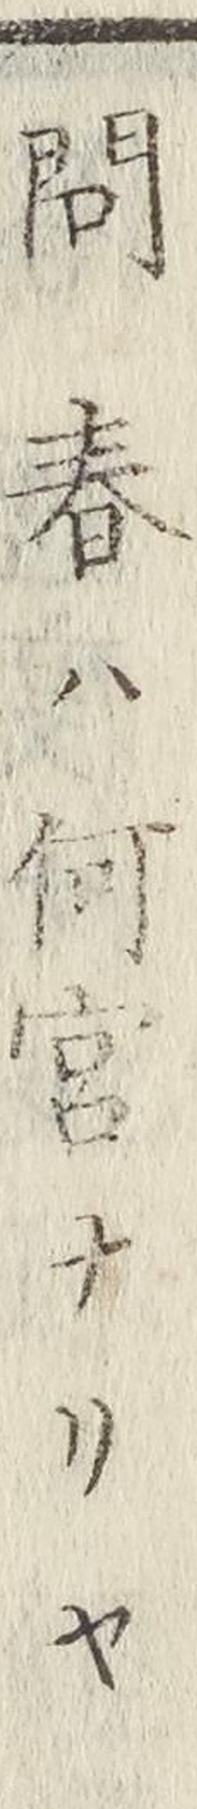問春ハ何宮ナリヤ
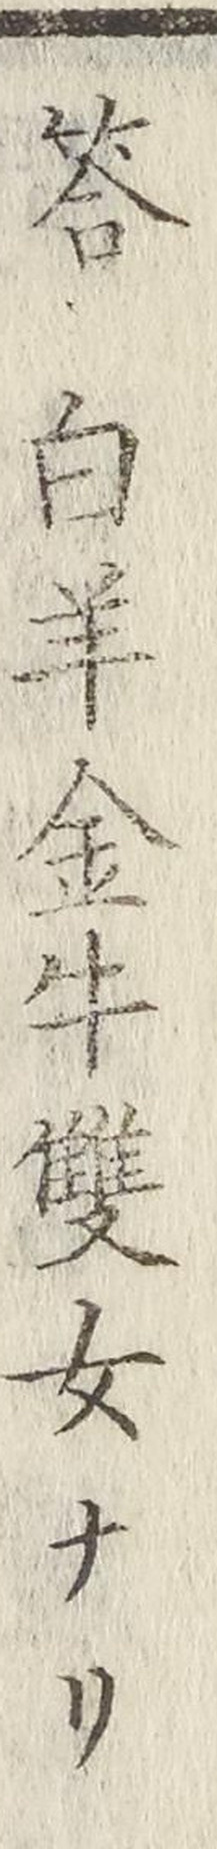答白羊金牛双女ナリ
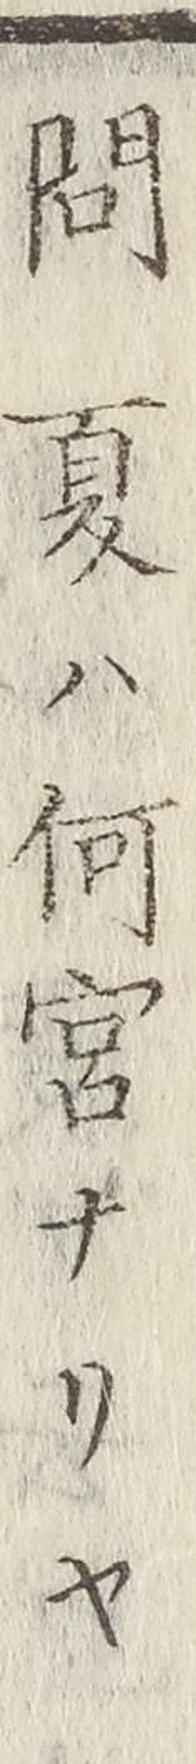問夏ハ何宮ナリヤ
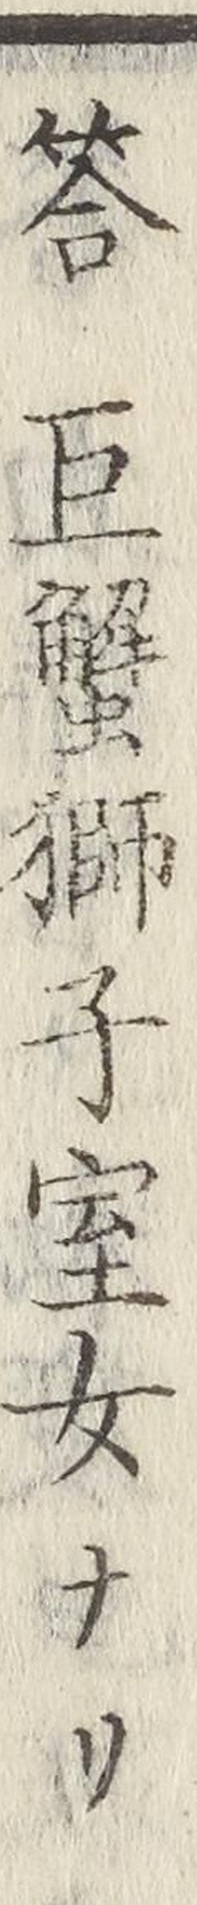答巨蟹獅子室女ナリ
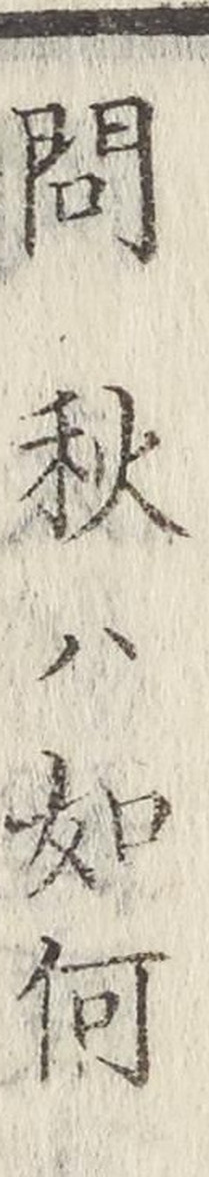問秋ハ如何
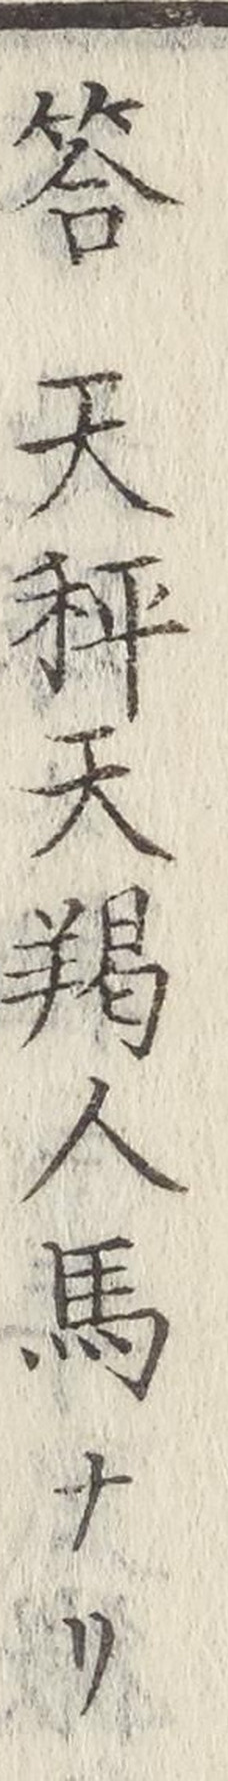答天秤天羯人馬ナリ
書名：星学圖説　上
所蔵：東京大学地震研究所図書室 Earthquake Research Institute Library, The University of Tokyo, JAPAN
